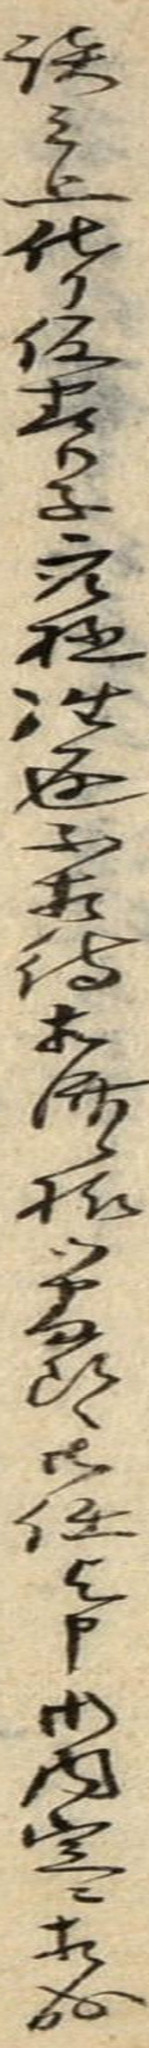談之上代り仮養子取極往返不相待相済候様御番頭へ御任与申御内定ニ相成
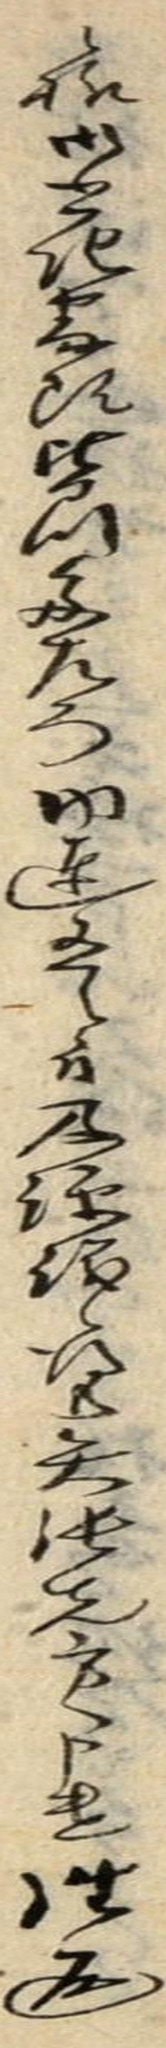候様御書院番頭皆川多左衛門内達有之ニ付及評議候得共矢張先方へ申遣往返

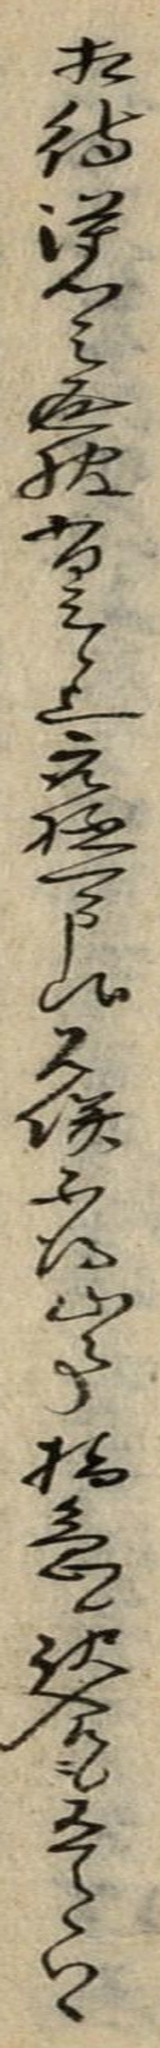相待得心之返報有之候上取極可申候乍併不得止事指急候訳合も有之候ハヽ
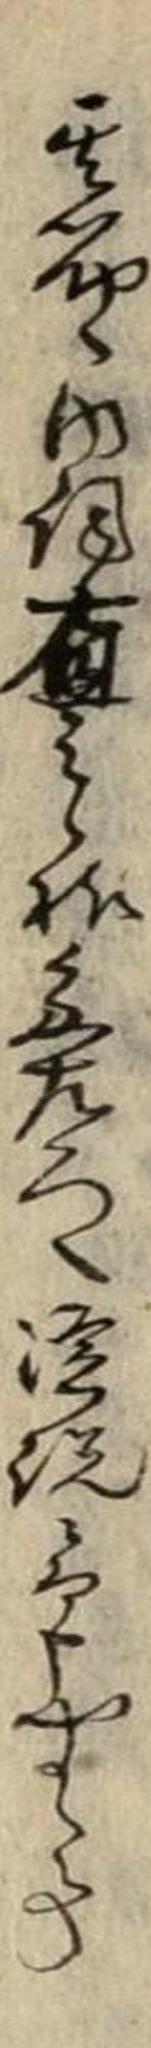其筋へ内伺有之候様多左衛門へ演説ニ而申聞候事
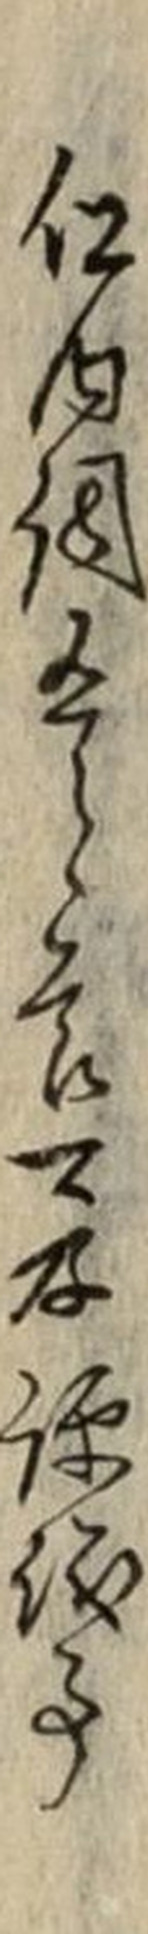但内伺有之候節可及評議事
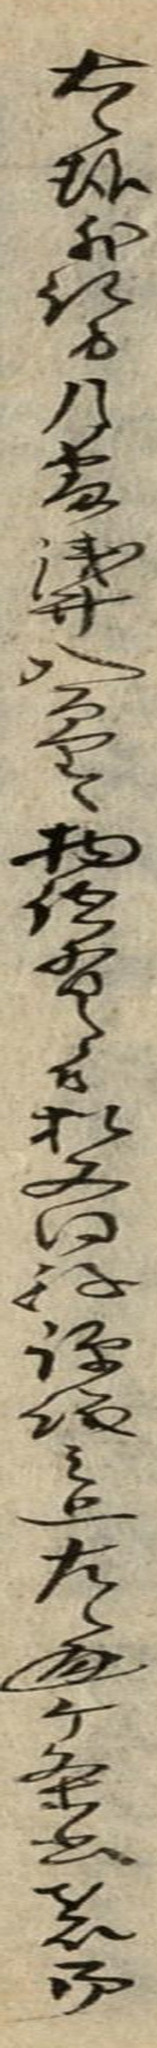右之趣外記方月番浅井八百里ヘ物語有之ニ付猶又同役評議之上左之通ヶ条書を以御
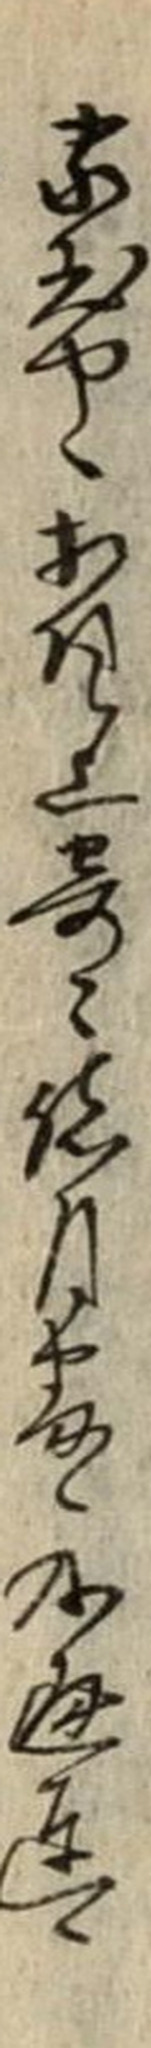家老中へ相伺之上寄々諸月番ヘ及通達候
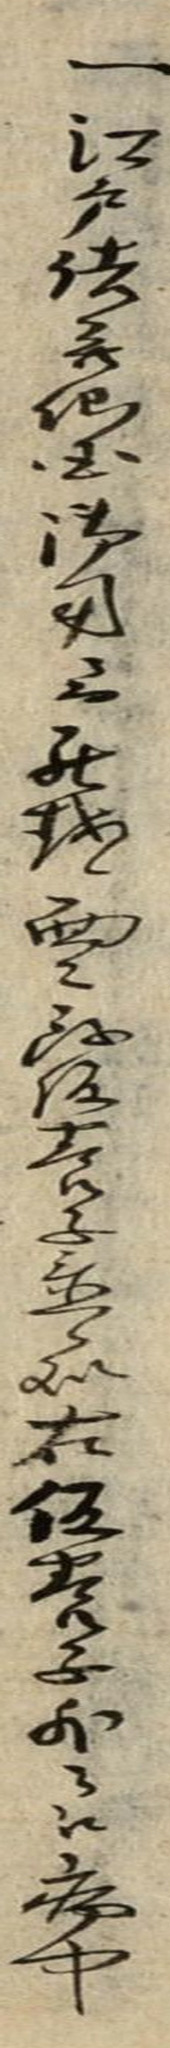一江戸詰并他国御用ニ而罷越候面々致仮養子置候処右仮養子外々江病中
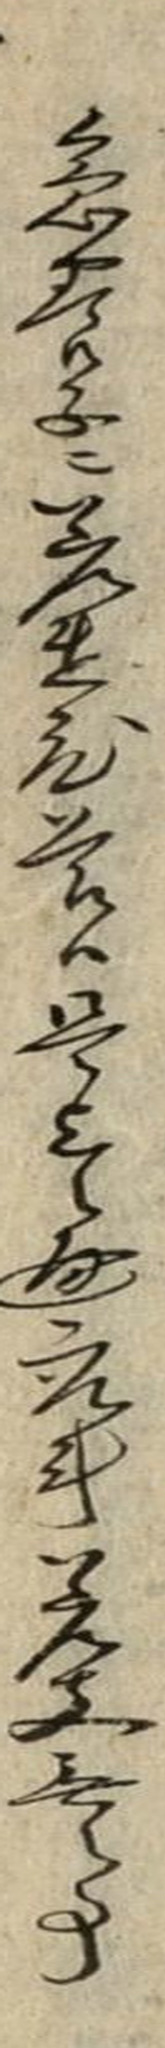急養子ニ差遣度節ハ是迄之通取斗差支無之事
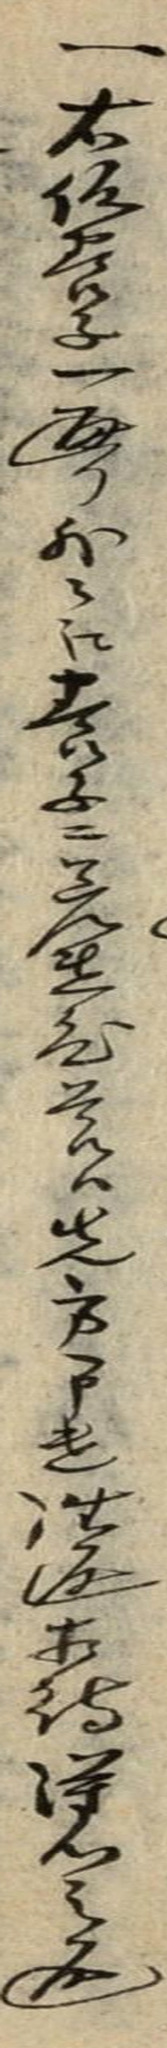一右仮養子一通り外々江養子ニ差遣度節ハ先方へ申遣往返相待得心之返
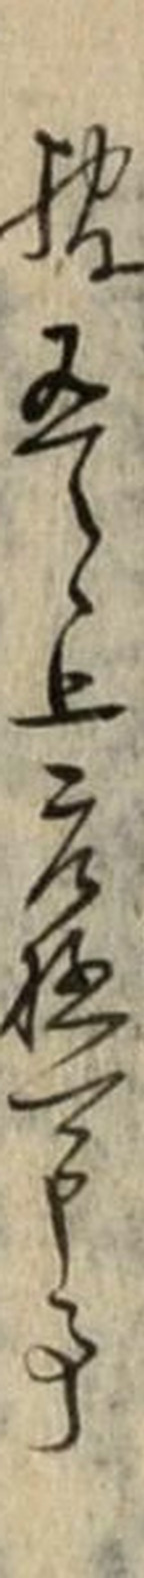報有之候上取極可申事
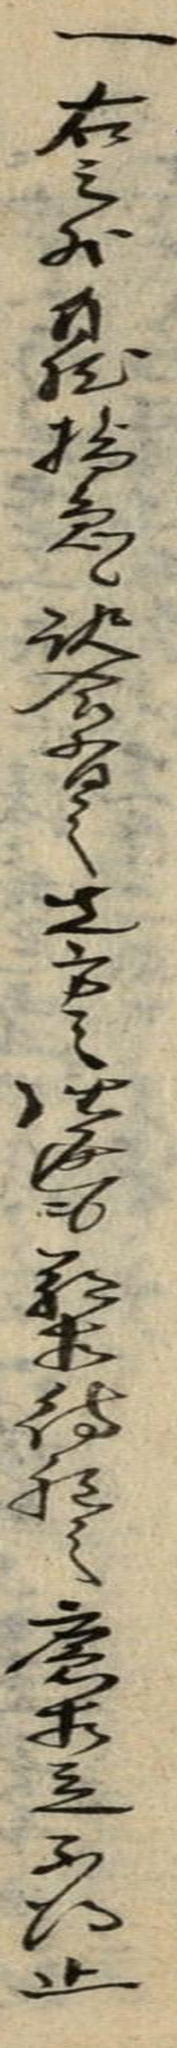一右之外自然指急候訳合有之先方之往返も難相待程之廉相立不得止
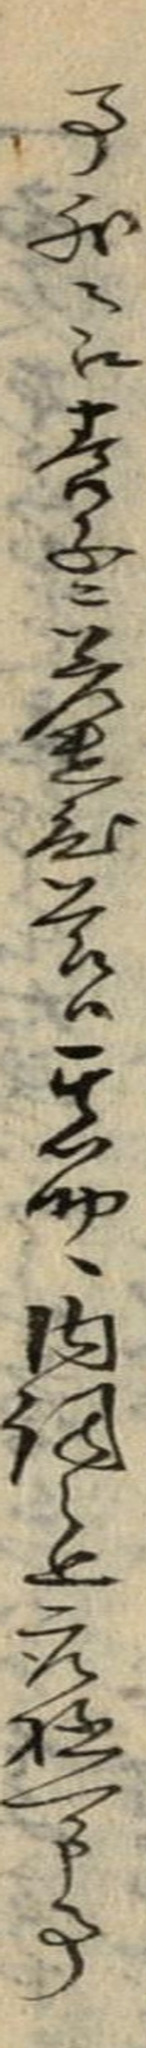事外々江養子ニ差遣度節ハ其筋ヘ内伺之上取極可申事
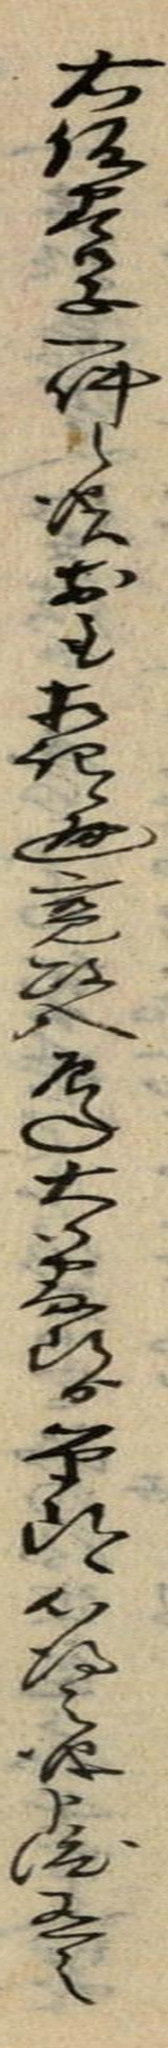右仮養子一件之儀ハ前二も相記候通寛政八辰年大御番頭ゟ筆頭へ心得之儀申渡有之
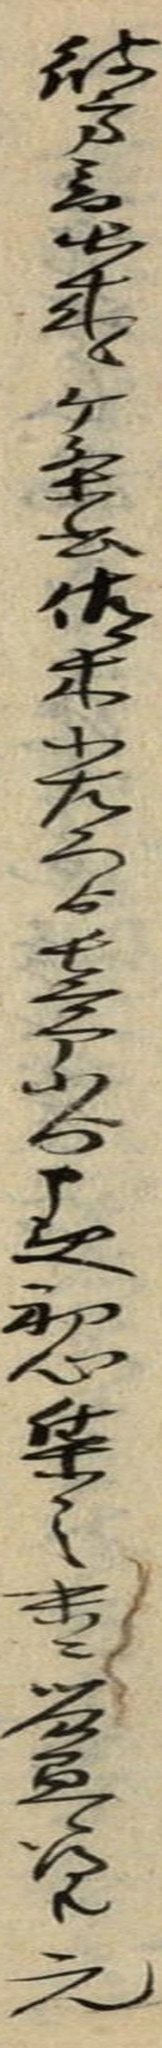彼方二而出来候ヶ条書佐々木小左衛門ゟ長谷部小右衛門申受初心集之末ニ留置候得共元
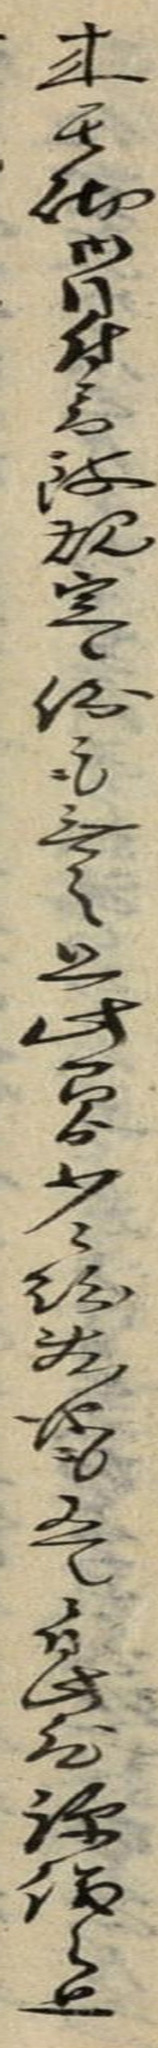来其砌御目付ニ而致規定候儀ニも無之且此間ゟ少々紛敷儀も有之ニ付此度評議之上
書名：養子縁組之部
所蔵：福井県文書館 Fukui Prefectural Archives
